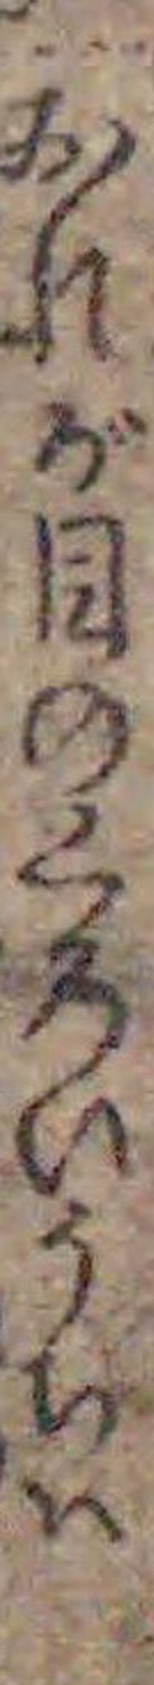〽おれが目のくろいうちは
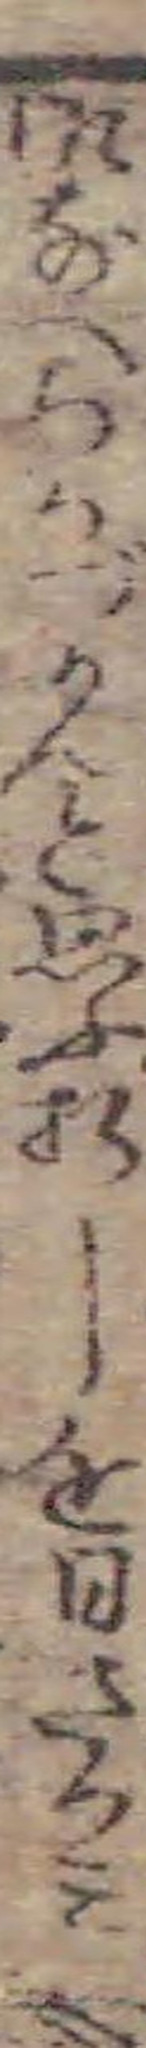御前へちかづかんと思ふ折し近日さかみ
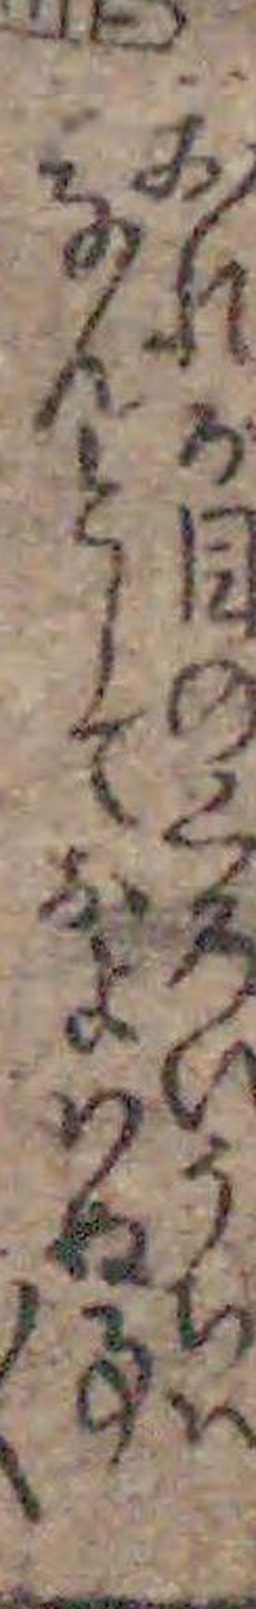なんとしておよはぬ事
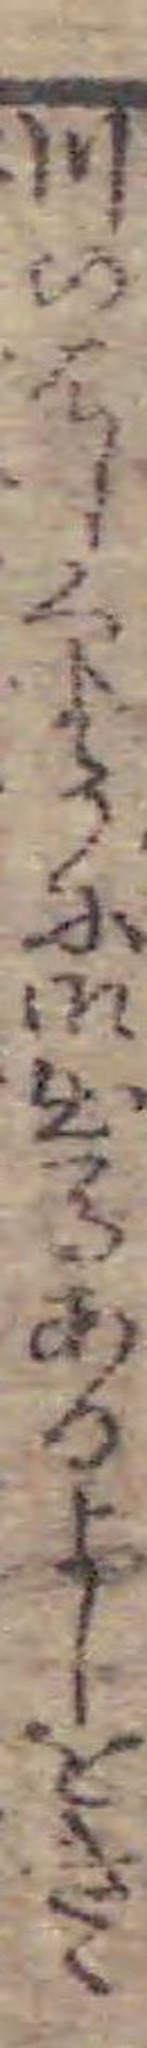川のはしくように御出馬あるよしをきゝ
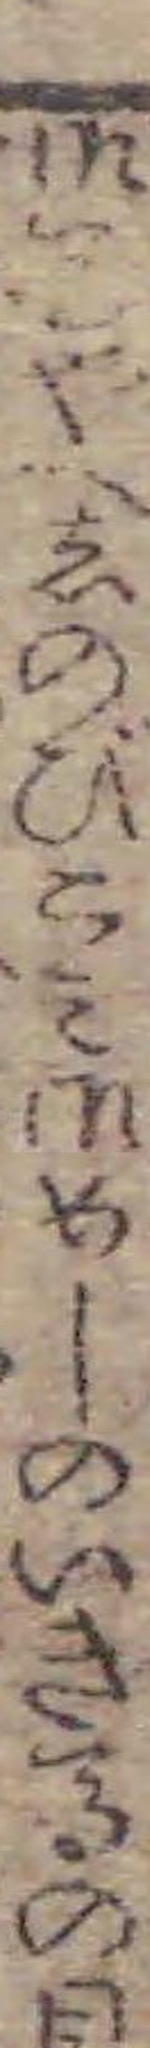御馬やへしのびこみ御めしのいき馬の目
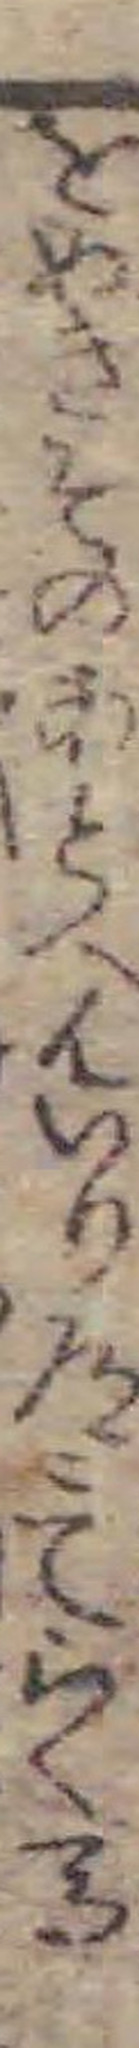をぬきそのあとへはいり道にてらく馬
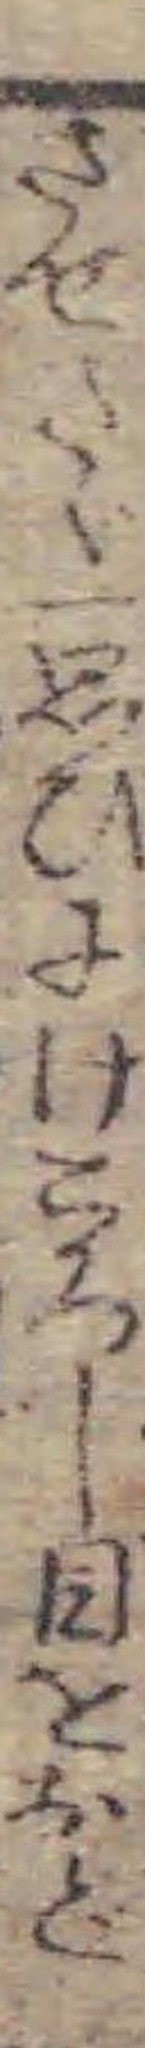させたゞ一思ひにけころし目をおど
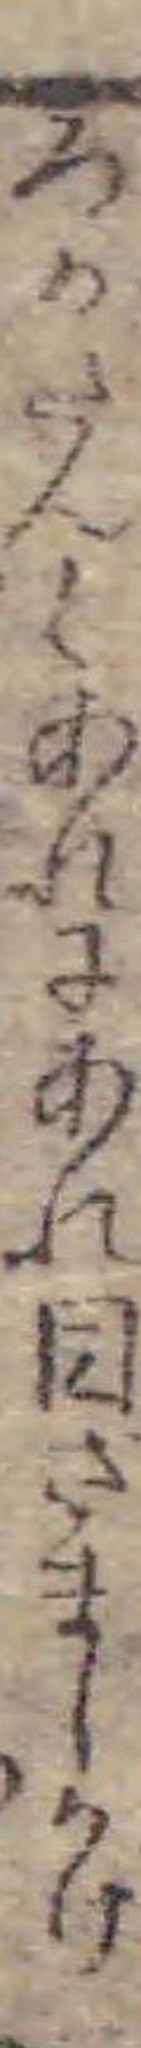ろかさんとあれにあれ目ざましかけ
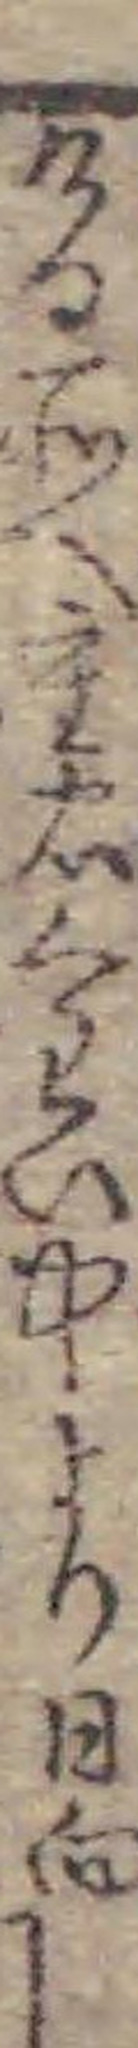ける所へ重忠くわい中より日向
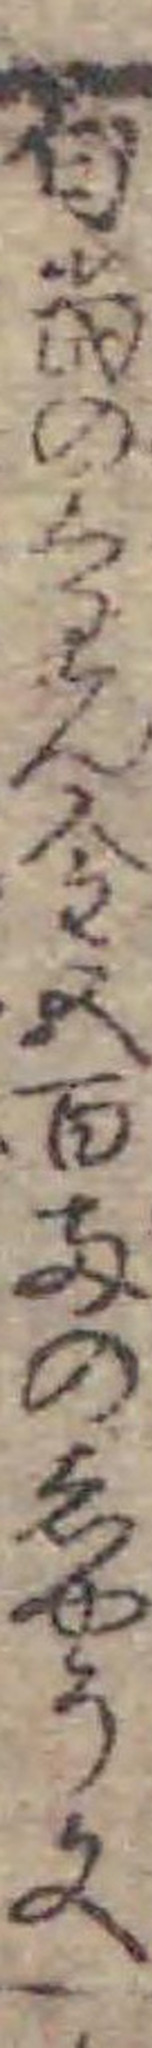勾当のくわん金五百両のしやう文
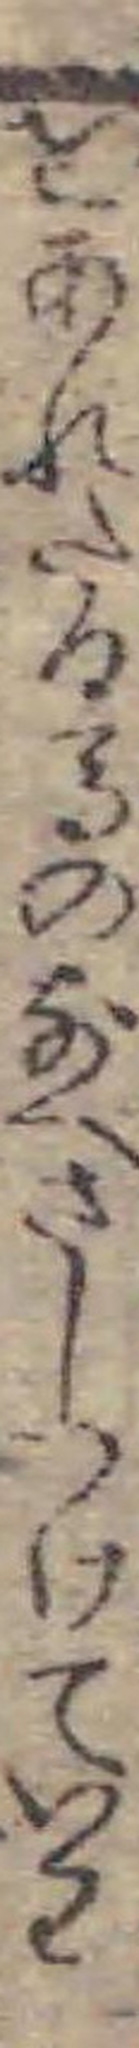をあれたる馬の前へさしつけていわ
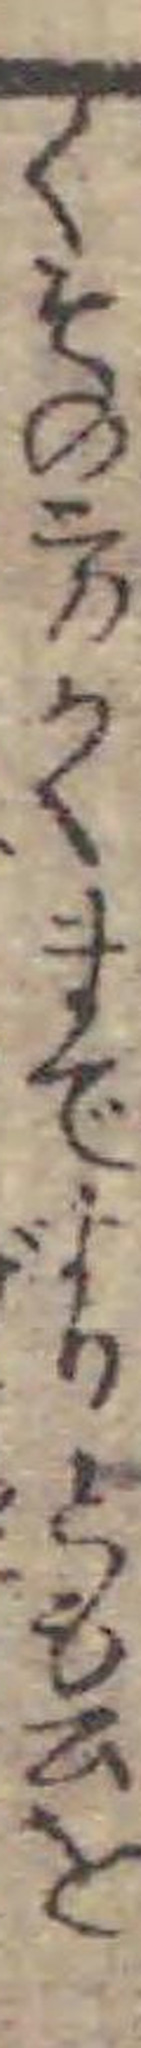くその方かくまでよりとも公を
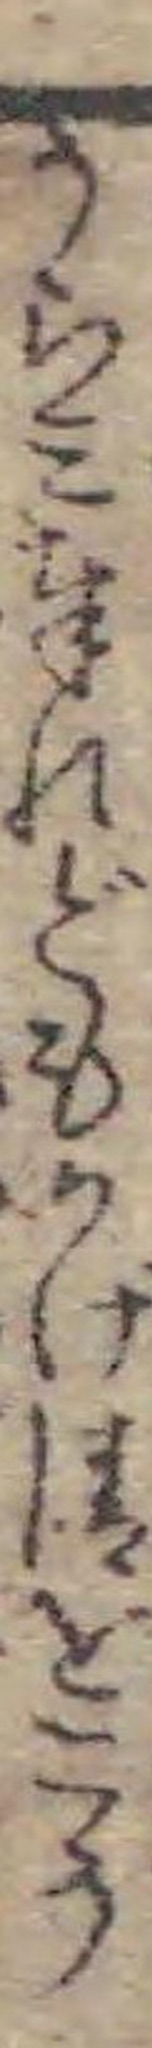うらみ奉れどもかげ清をこう
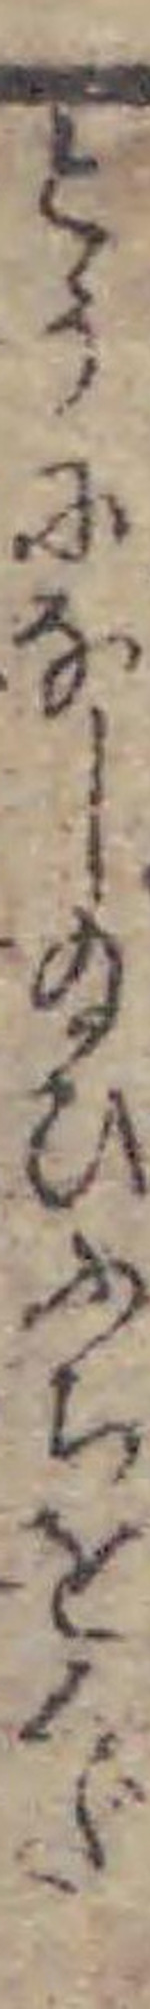とうになし給ひふちをくだ
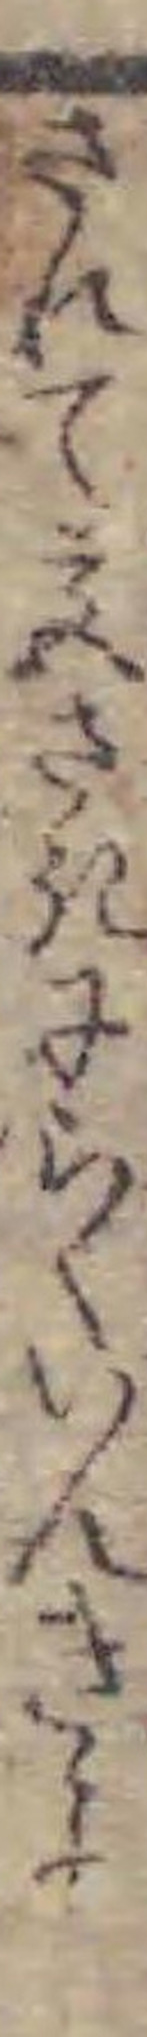されて宮さきにらくいんきよ
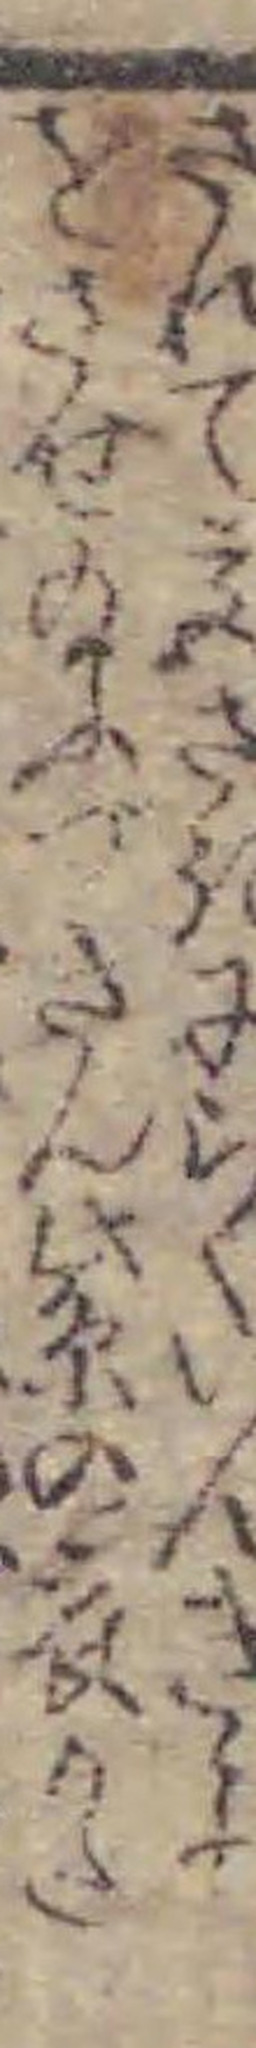をさせ給ふづきん紫の衣かた
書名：悪七変目景清 : 2巻
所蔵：国立国会図書館 National Diet Library, JAPAN
